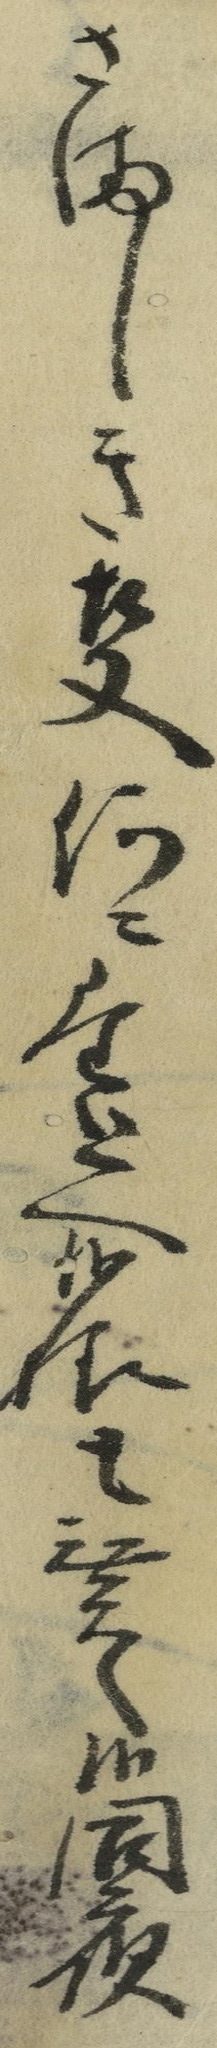さましき事何にたとへ候様も無之候同夜
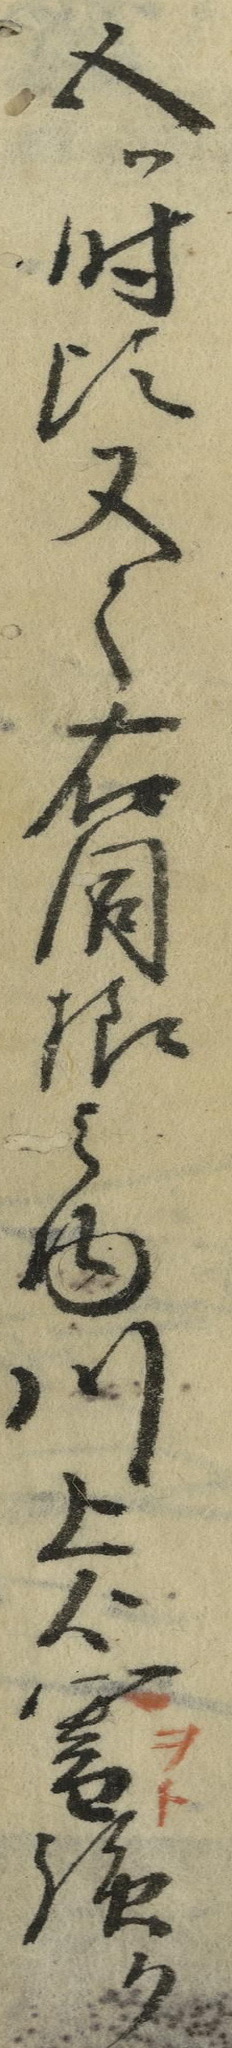五ツ時頃又々右同様之内川上ゟ響強ク
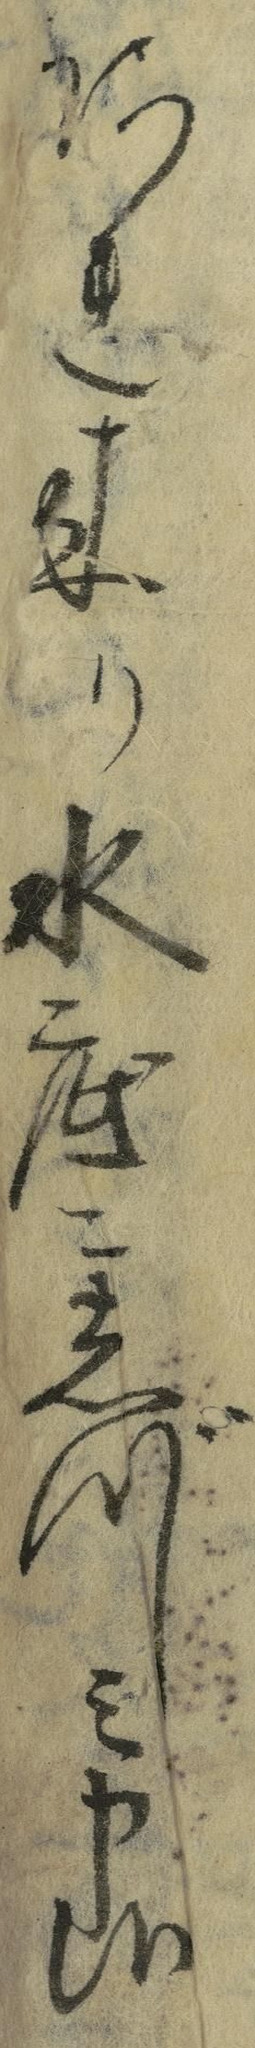何れ来り水底にしづみ申候
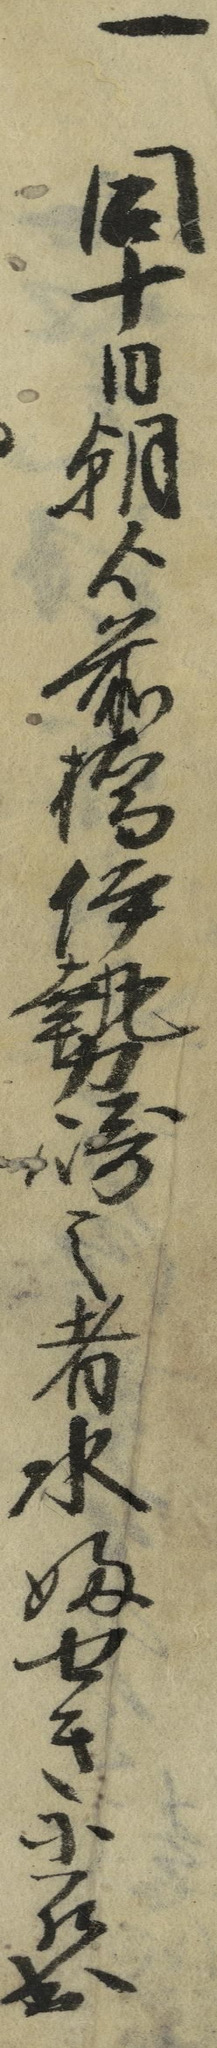一同十日朝ゟ前橋伊勢崎之者水ふセきに罷出
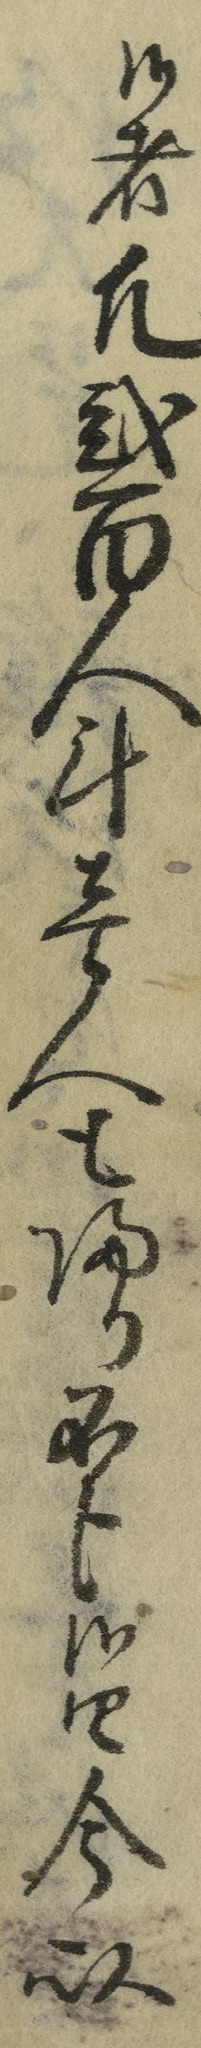候者凡弐百人計壱人も帰り不申候由今以
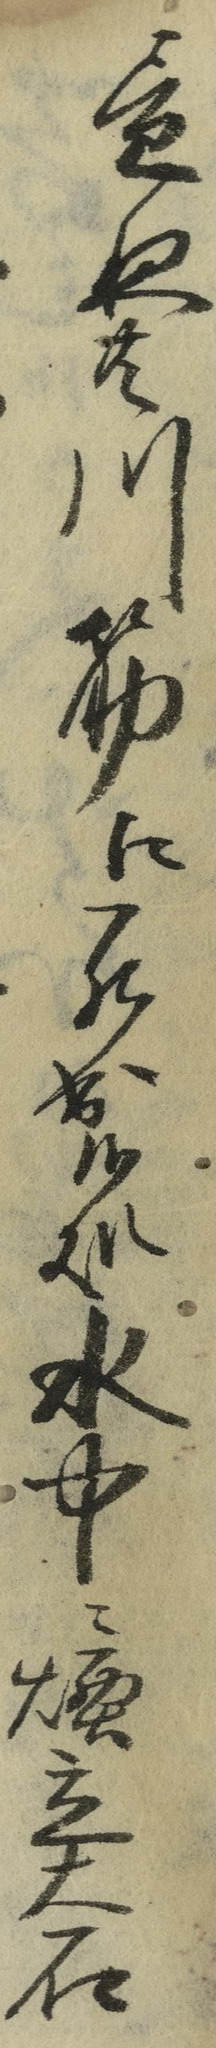昼夜共川筋江罷出候処水中に煙立大石
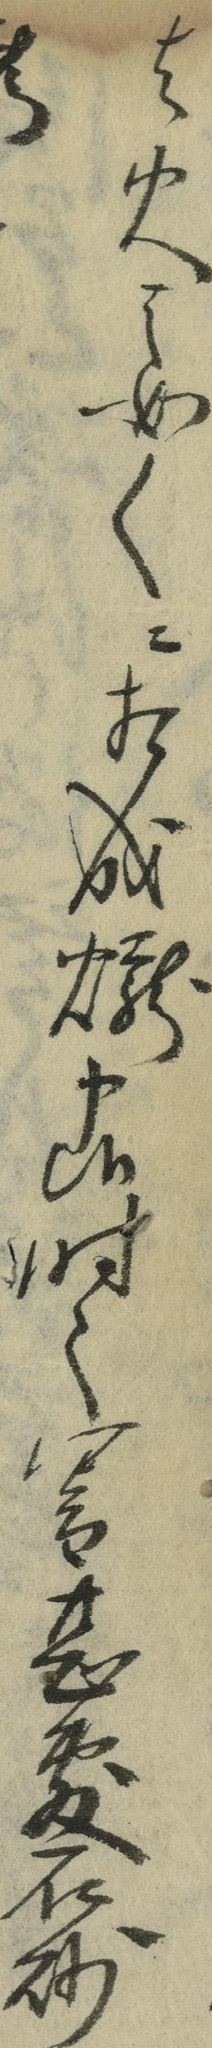者火之如くに相成燃申候時々響甚敷石砂
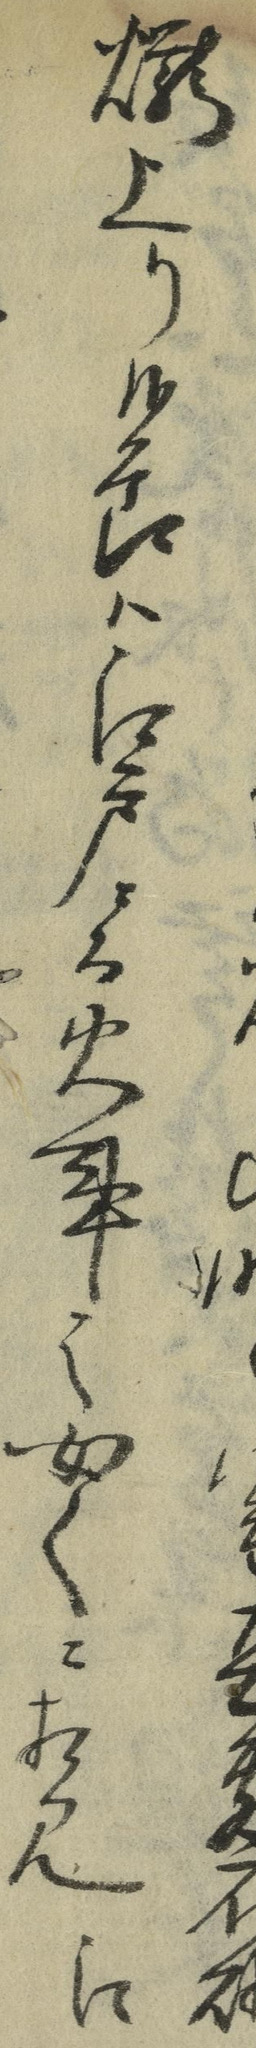燃上り候節は江戸に而火事之如くに相見え
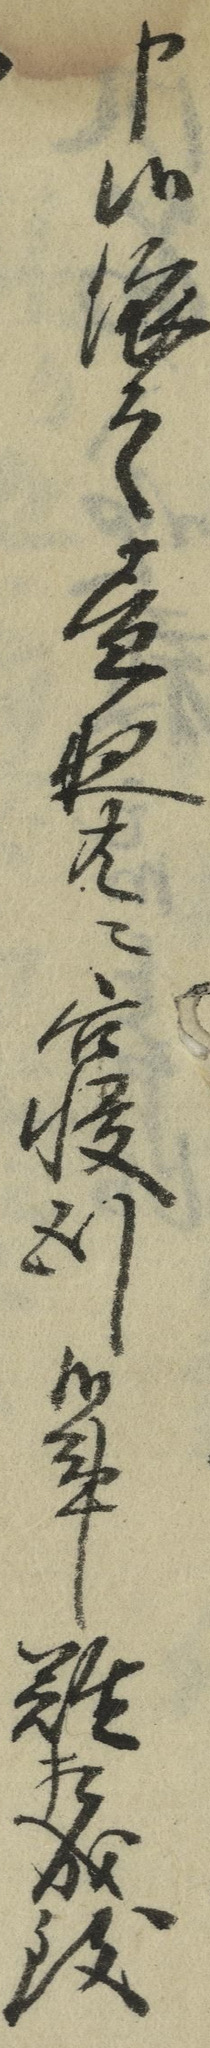申候依之昼夜共に寝臥候事難相成致
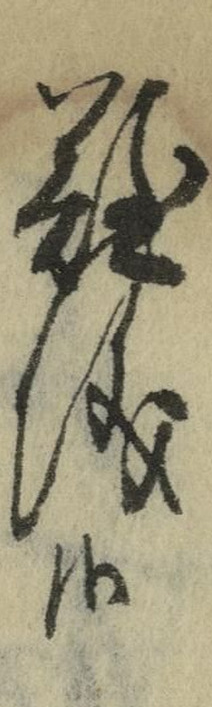難儀候
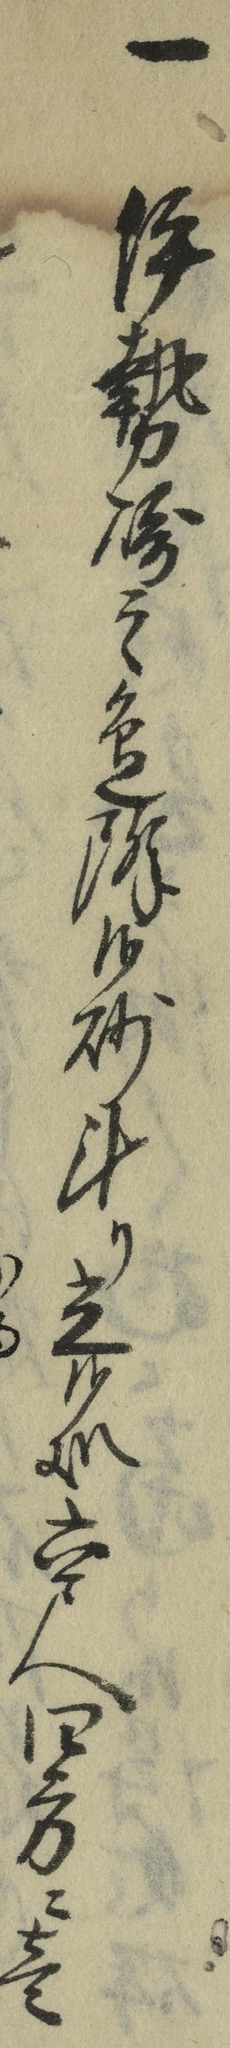一伊勢崎之辺降候砂計り定候処六尺四方に壱
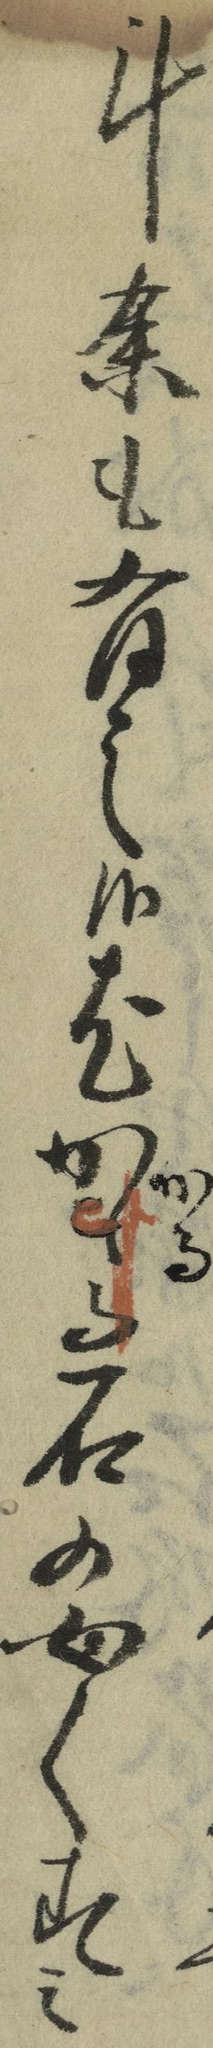斗余も有之候尤かる石の如くすみ

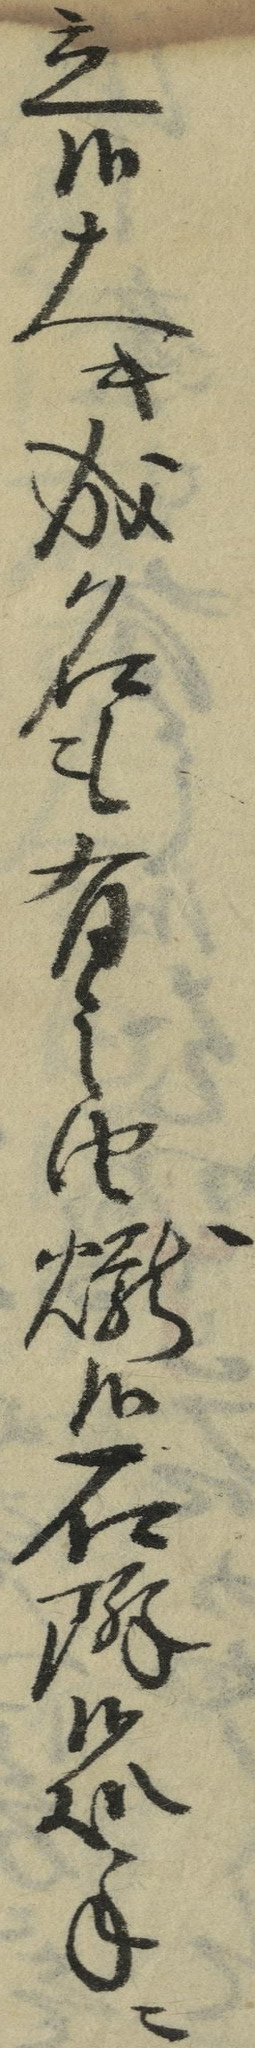立候大キ成名も有之由燃候石降候処手に
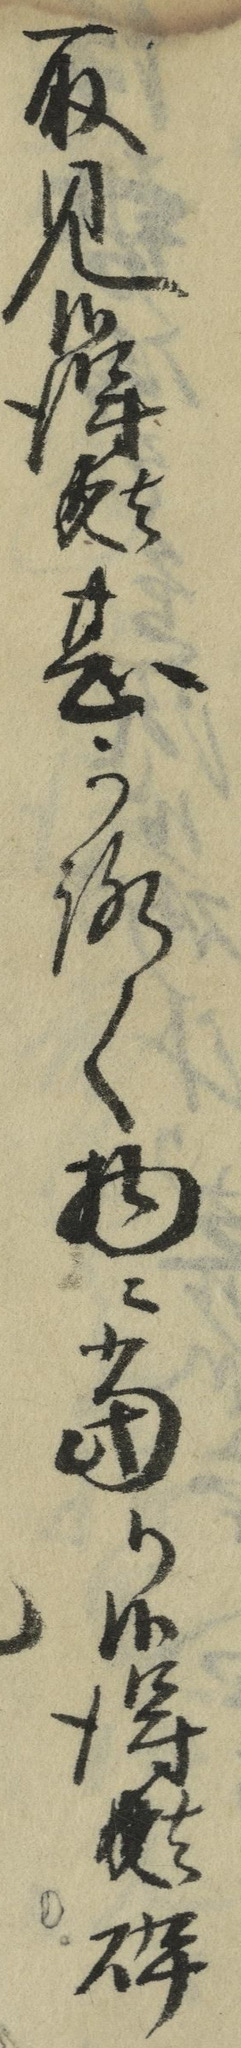取見候得者甚かろく物に当り候得者砕
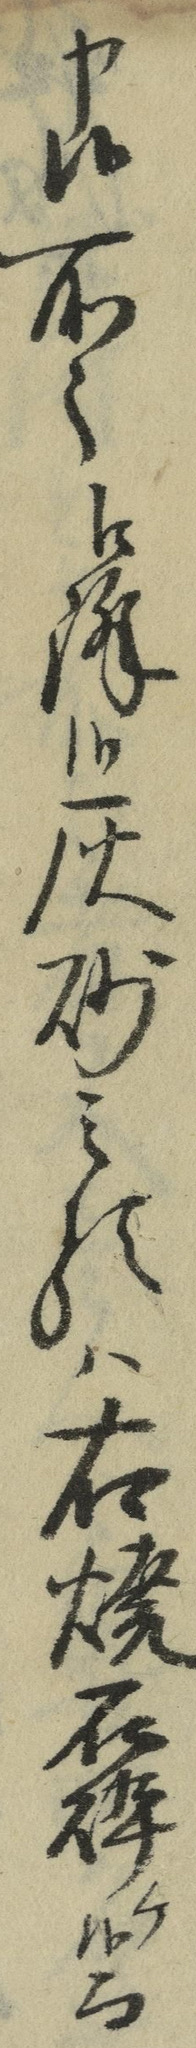申候所々江降候灰砂之類は右焼石砕ケ候而
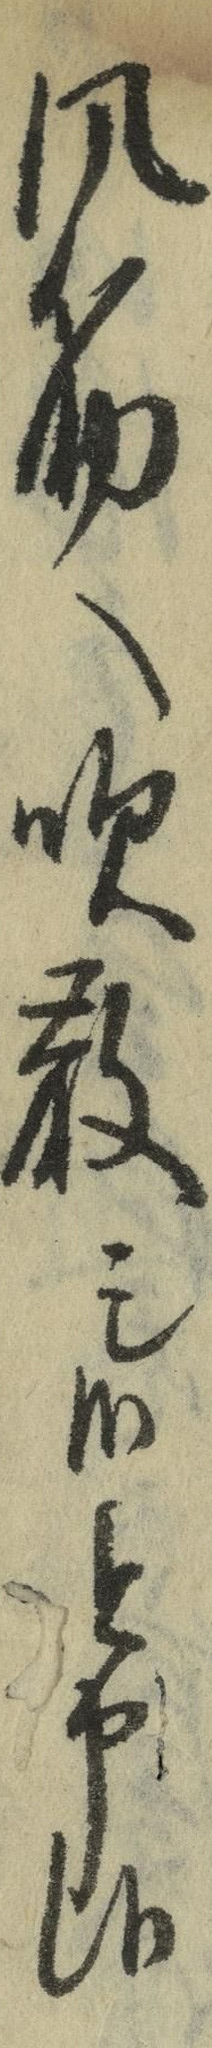風筋へ吹散シ候と申候
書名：天明三卯年七月　浅間山焼注進写
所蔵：東京大学地震研究所図書室 Earthquake Research Institute Library, The University of Tokyo, JAPAN
